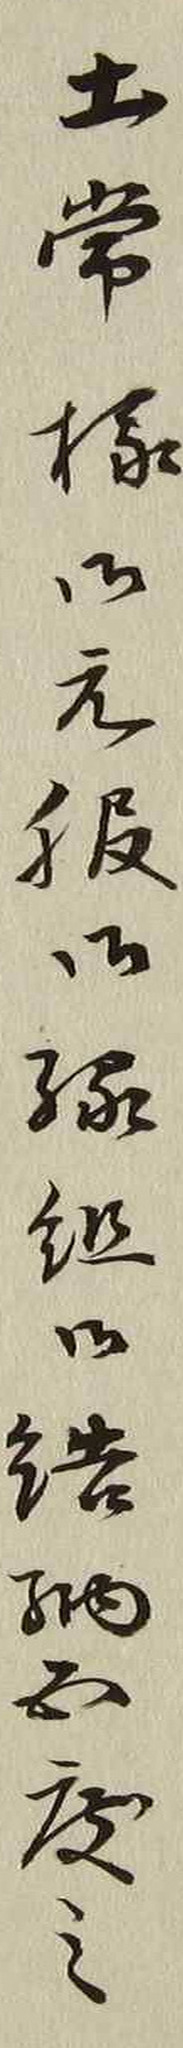土常様御元服御縁組御結納五度之
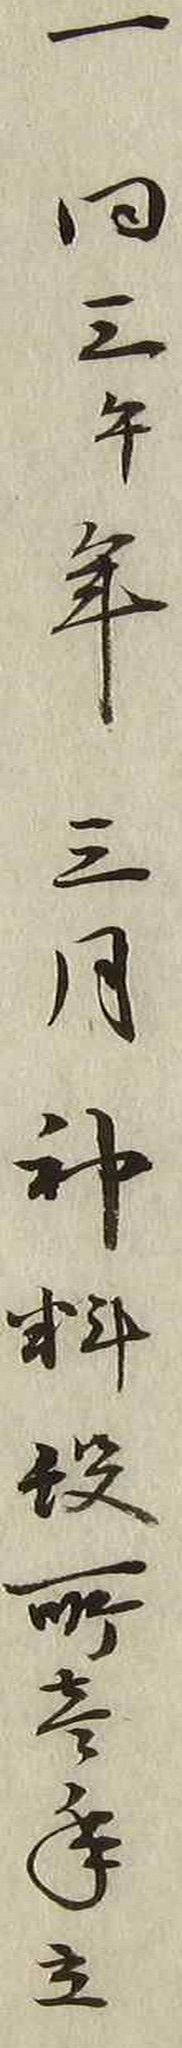一同三午年三月神様料役所壱年立
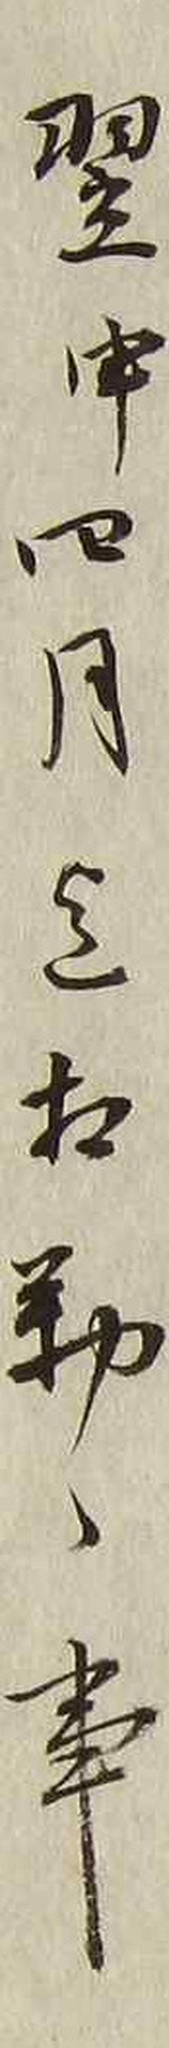翌申四月迄相勤め候事
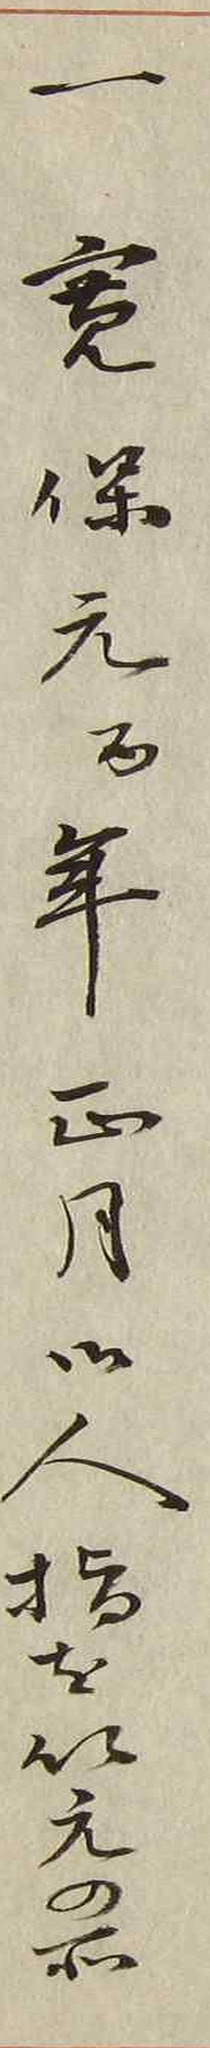一寛保元酉年正月御人指しを以元の所

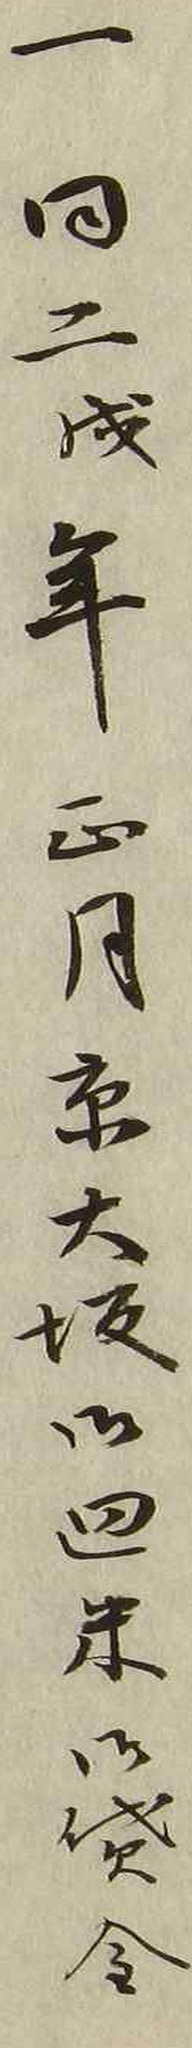一同二戌年正月京大坂御廻米御貸金
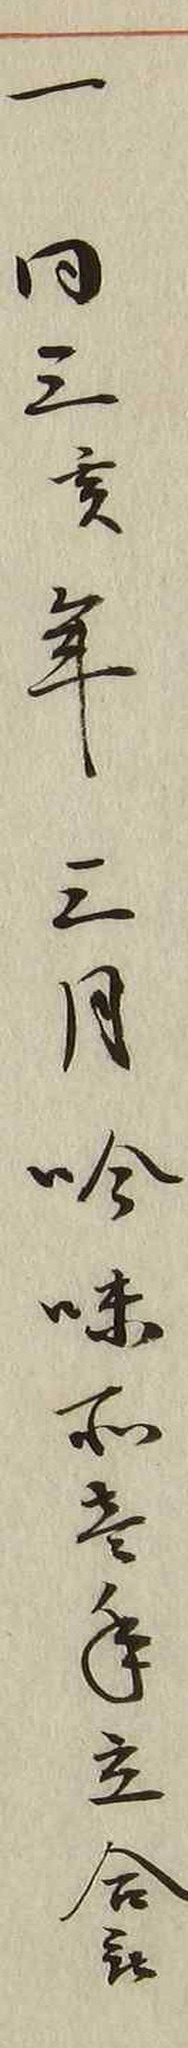一同三亥年三月吟味所壱年立会
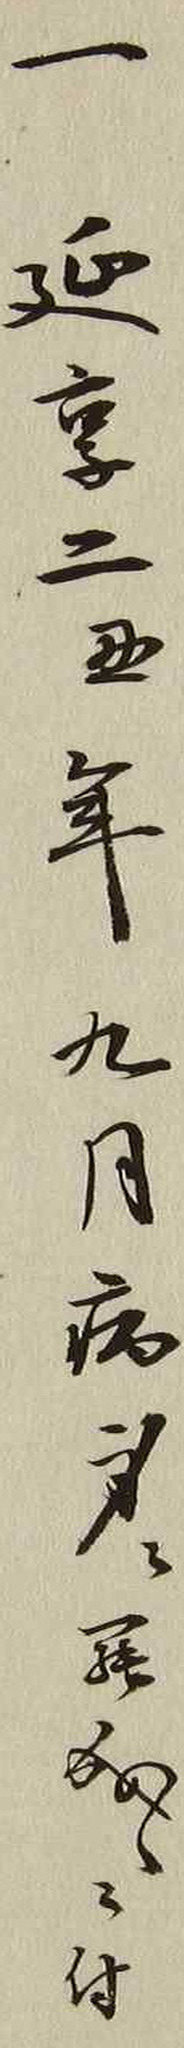一延享二丑年九病身ニ罷り成り候ニ付き
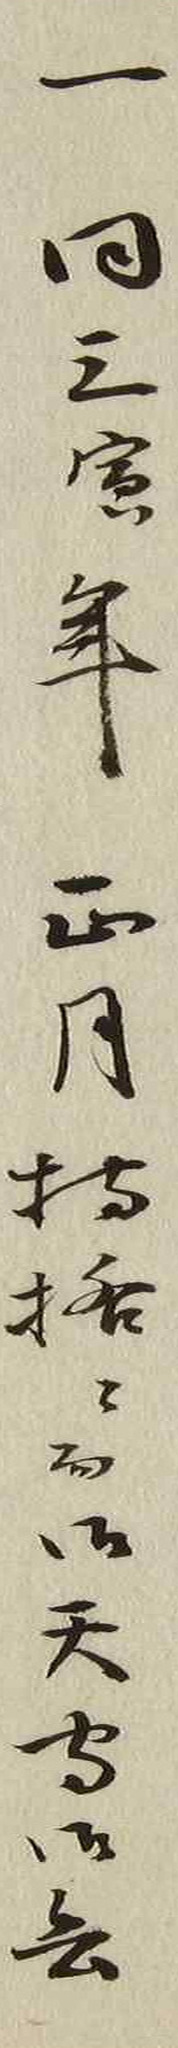一同三寅年正月持格ニて御天守御兵
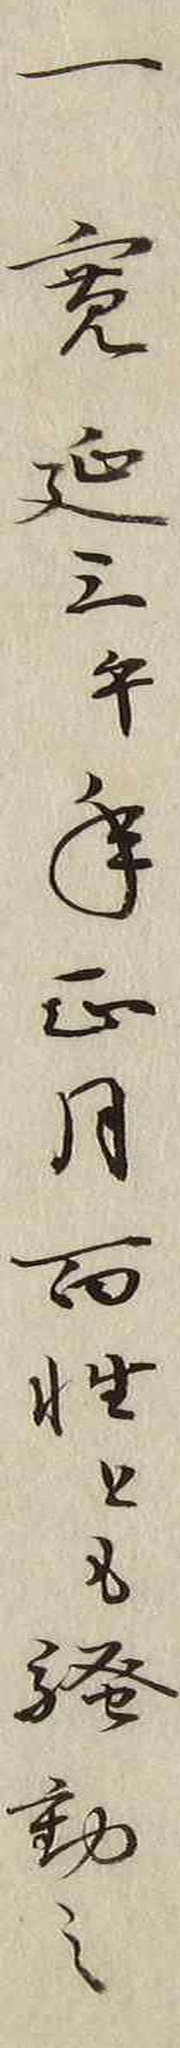一寛延三午年正月百姓とも騒動之
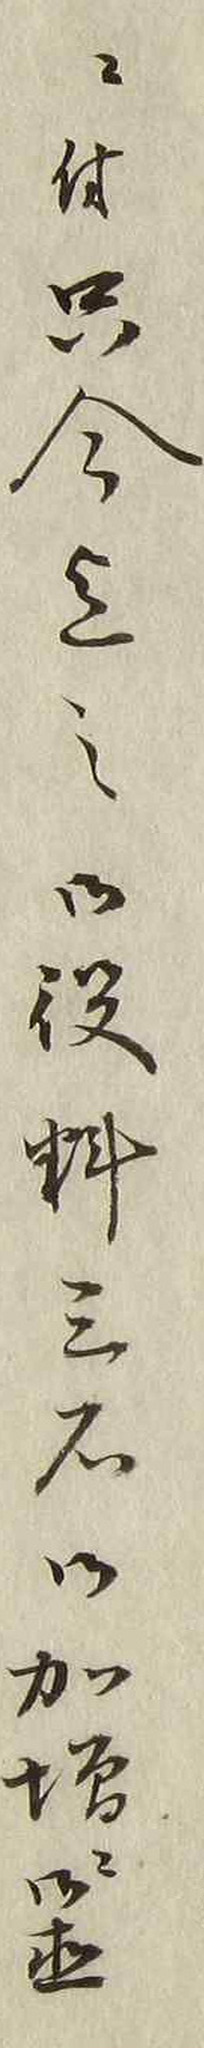ニ付き只今迄之通り御役料三石御加増ニ御直

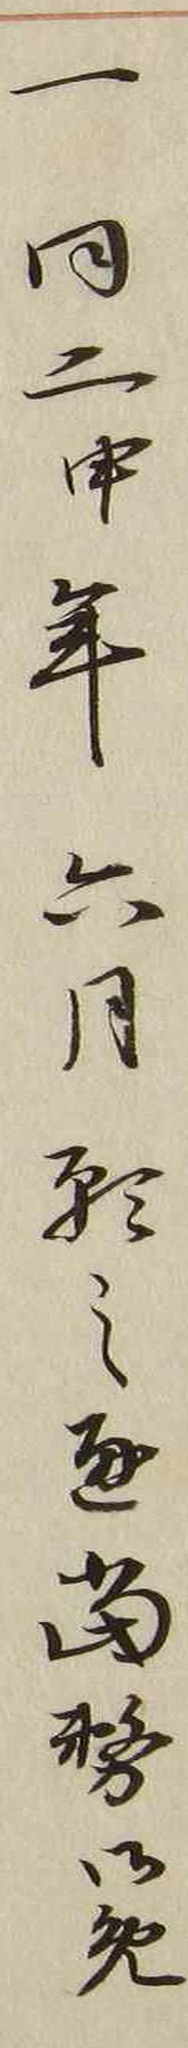一同二申年六月願い之通り当努御免
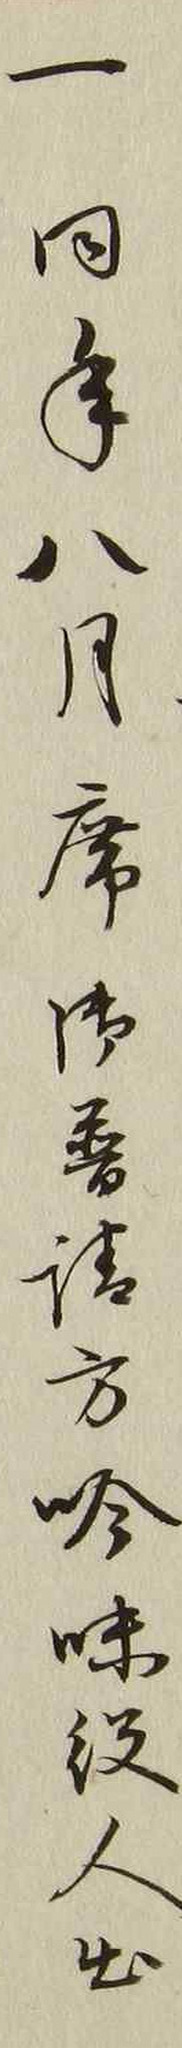一同年八月席御普請方吟味役人出
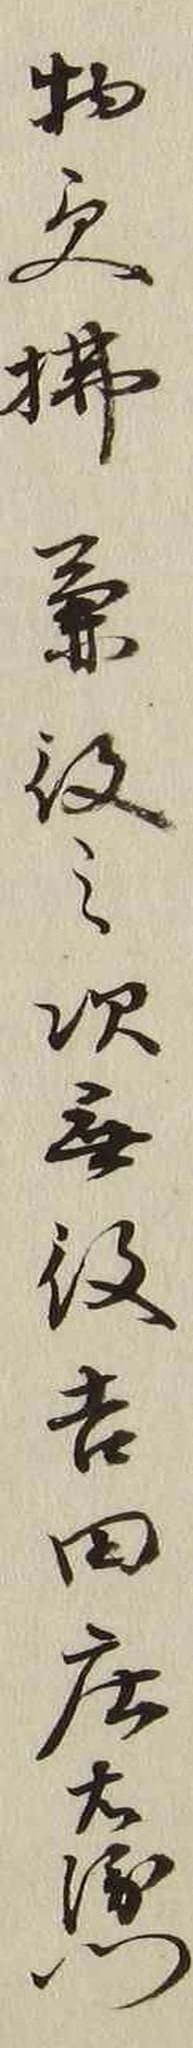物受拂い兼務之次無役吉田庄右衛門
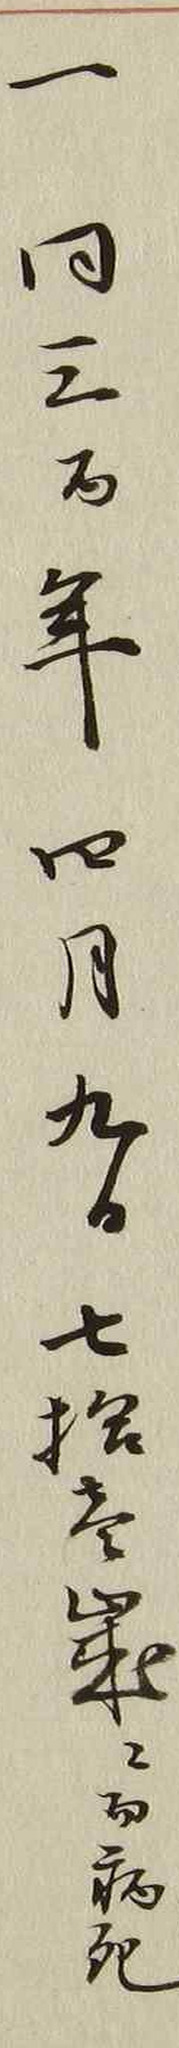一同三酉年四月九日七拾壱歳ニて病死
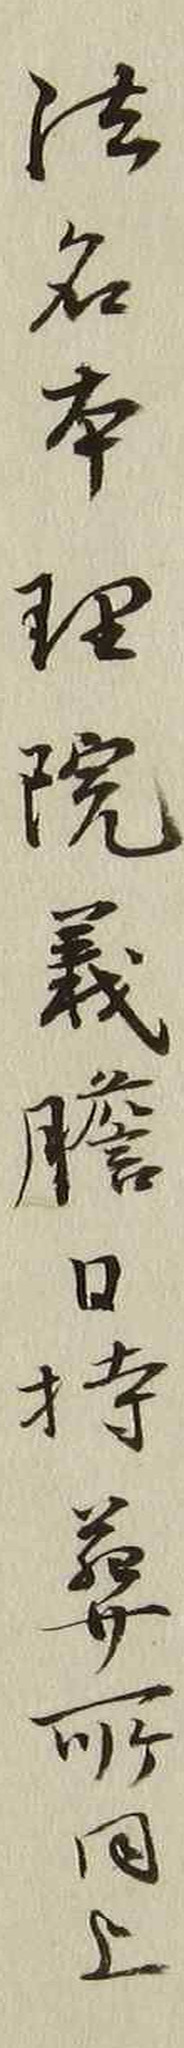法名本理院義膽日持葬所同上
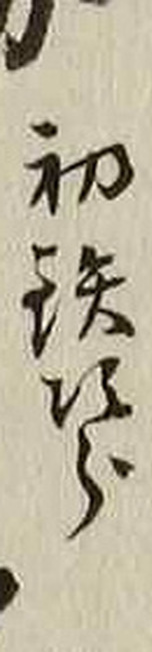初鉄次郎
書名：諸士系譜　巻之16　い之部16
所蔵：会津若松市立会津図書館
